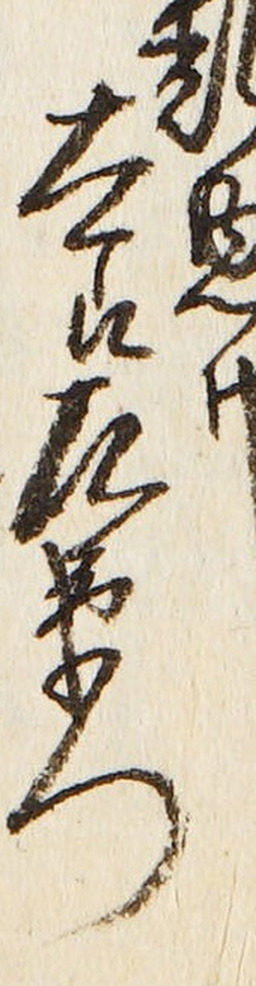太郎左衛門
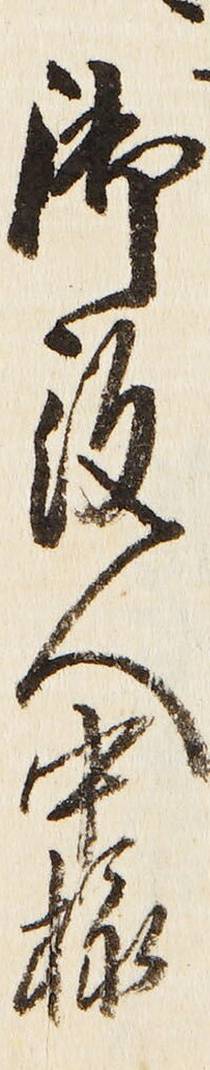御役人中様
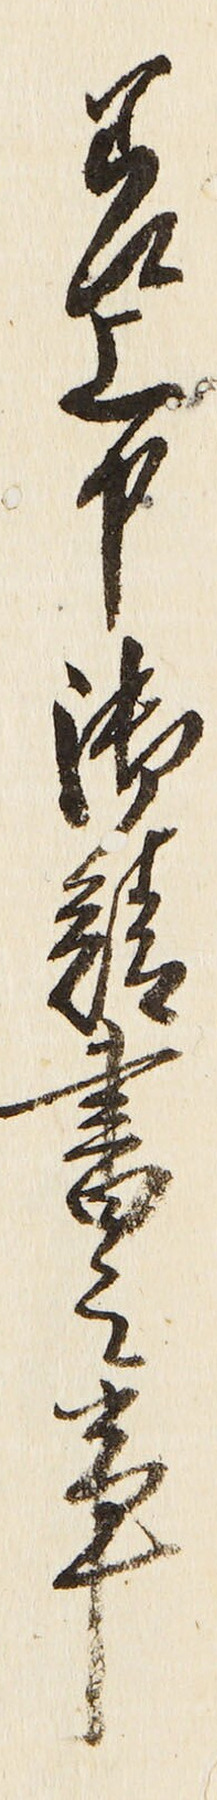差上申御請書之事
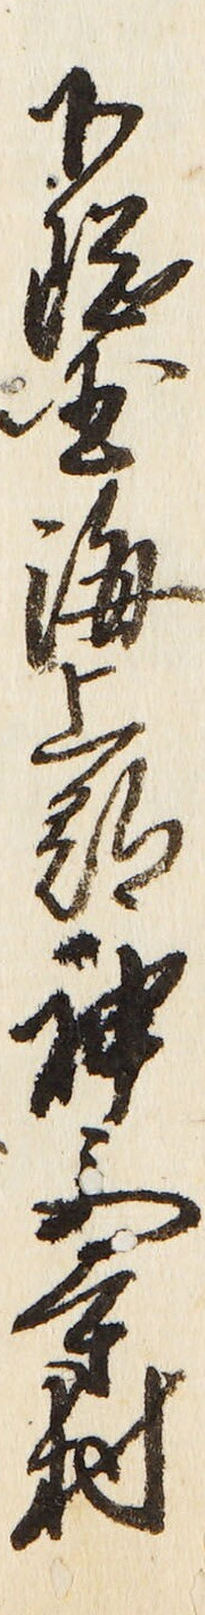下総国海上郡神宮寺村
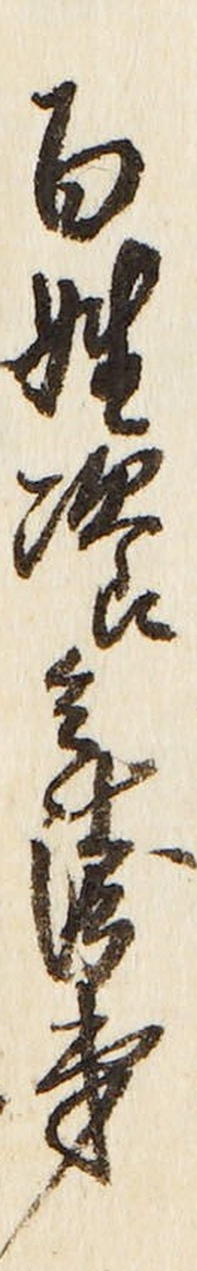百姓次郎兵衛弟
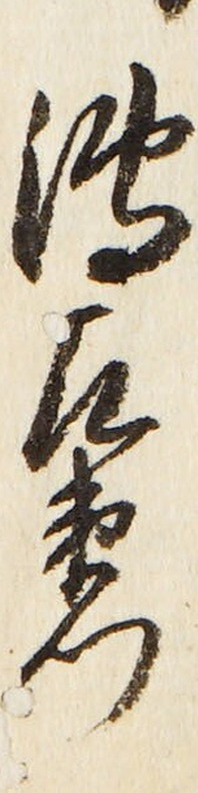伝左衛門
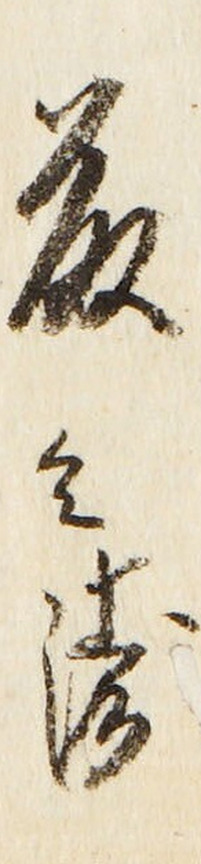藤兵衛
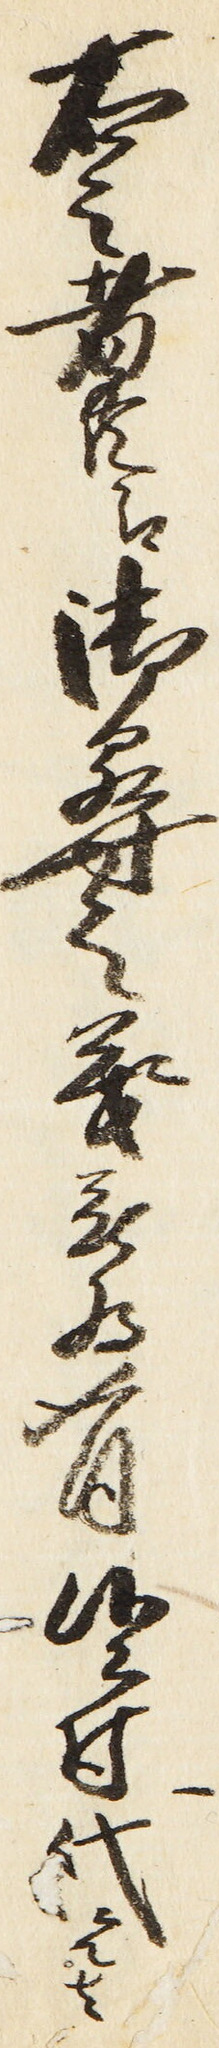右之者共江御尋之義被為有候ニ付代ニて者
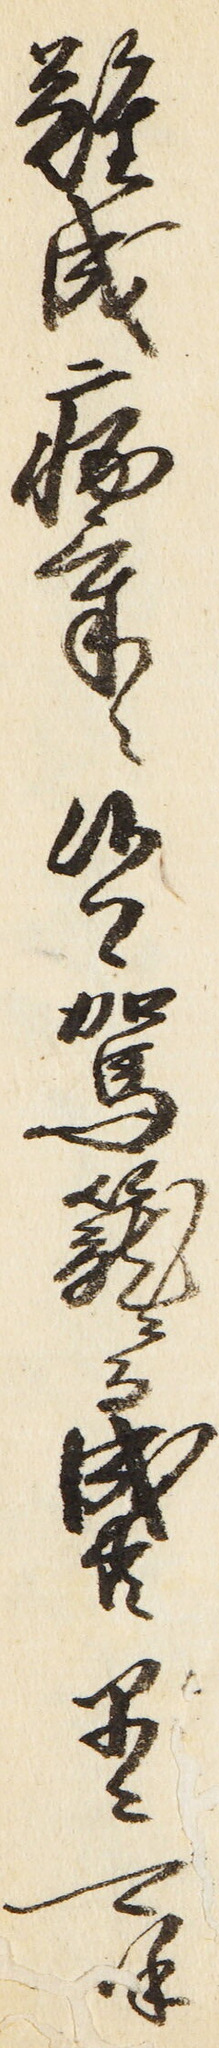難成病気ニ候ハヽ駕籠ニ而成共早々可呼

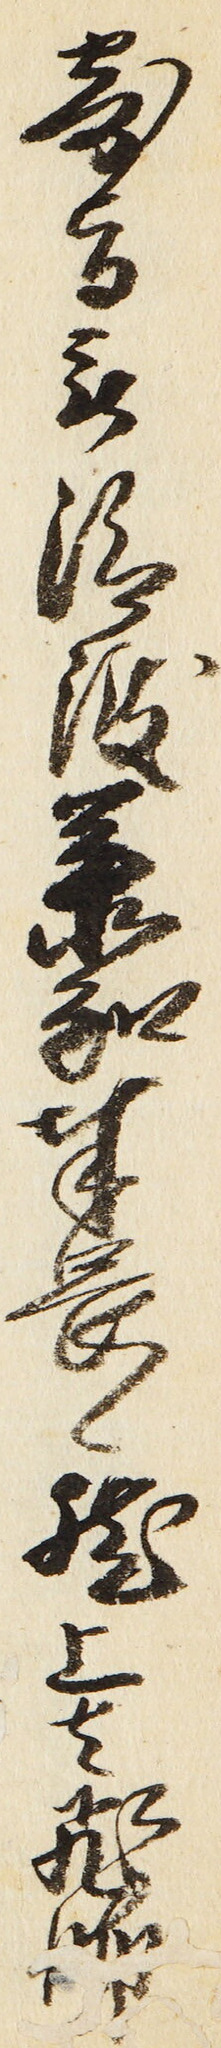寄旨被仰渡承知奉畏候然上者飛脚
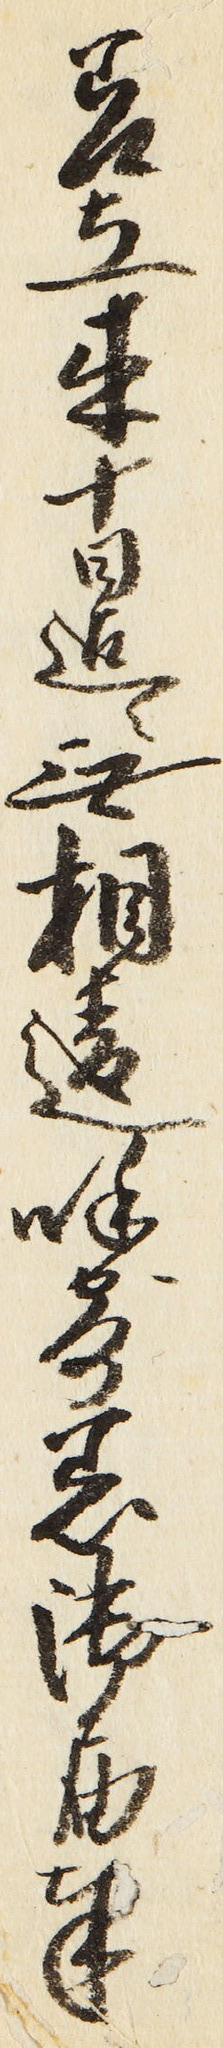差立来十日迄ニ無相違呼寄着御届奉
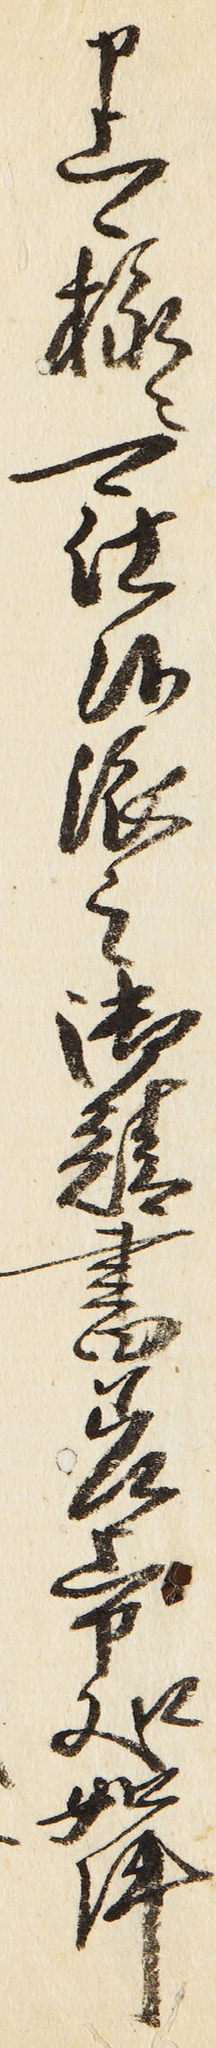申上候様ニ可仕候依之御請書差上候処如件
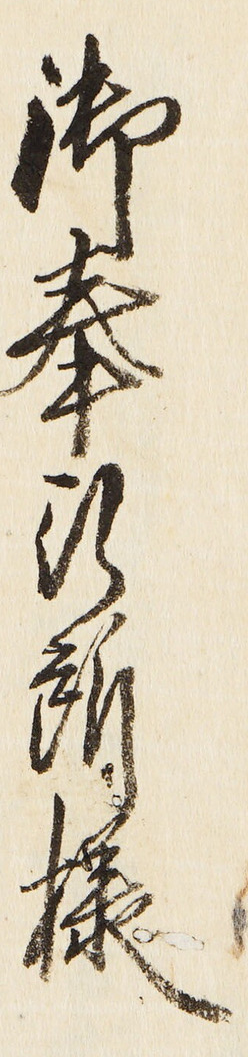御奉行所様
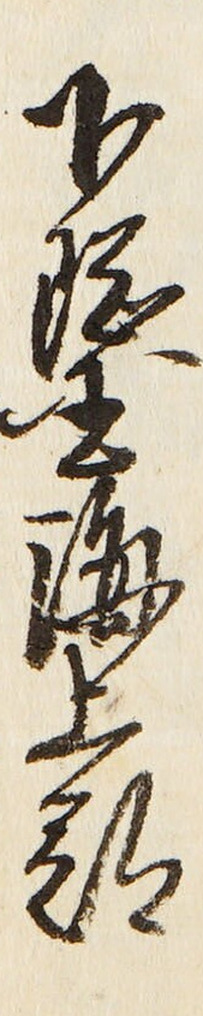下総国海上郡
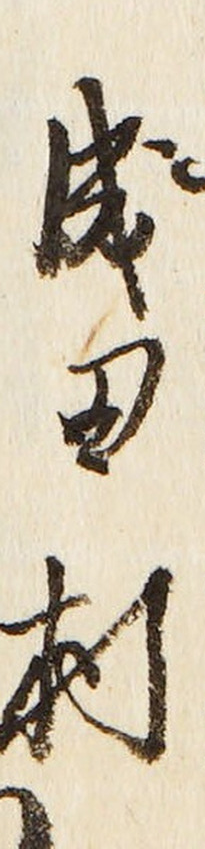成田村
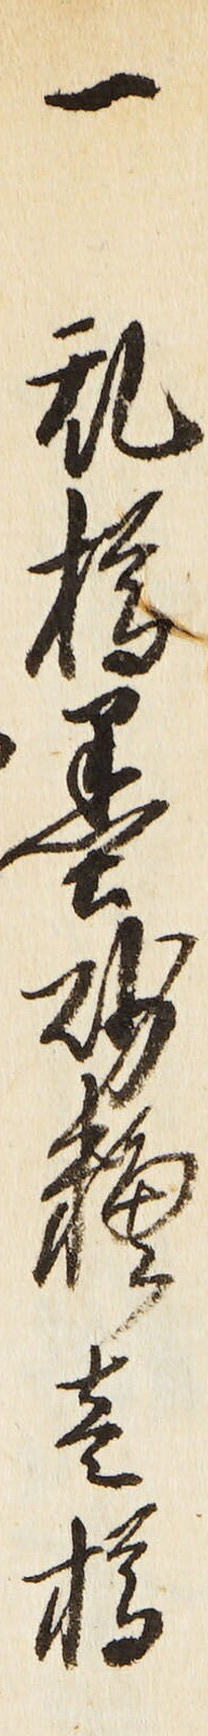一乱樽墨砂糖壱樽
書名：難船一件記録
